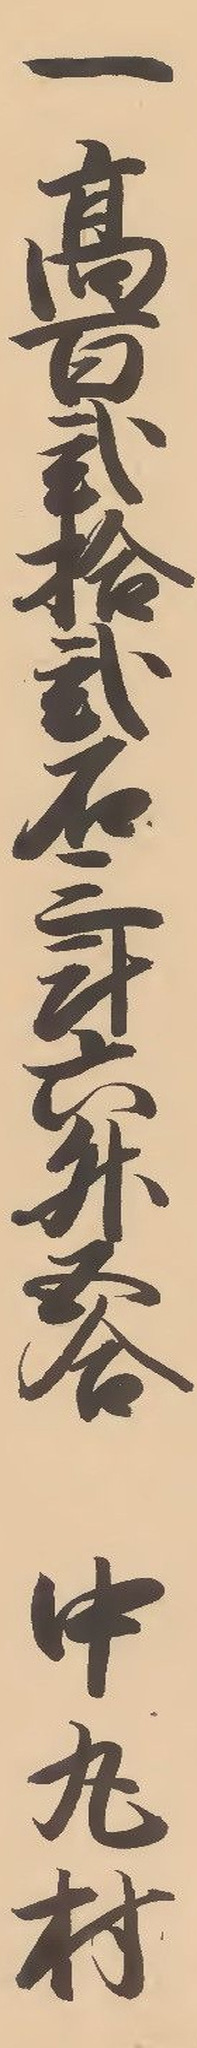一高百弐拾弐石三斗六升五合中丸村

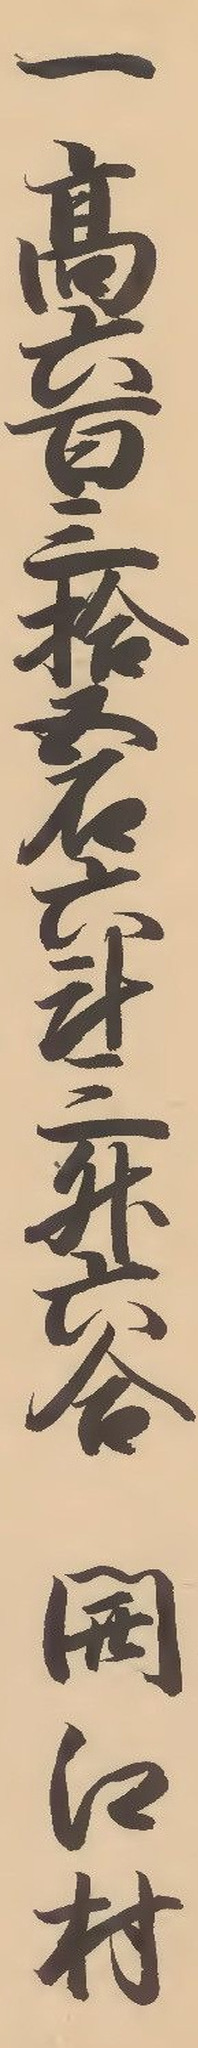一高六百三拾五石六斗三升六合開江村
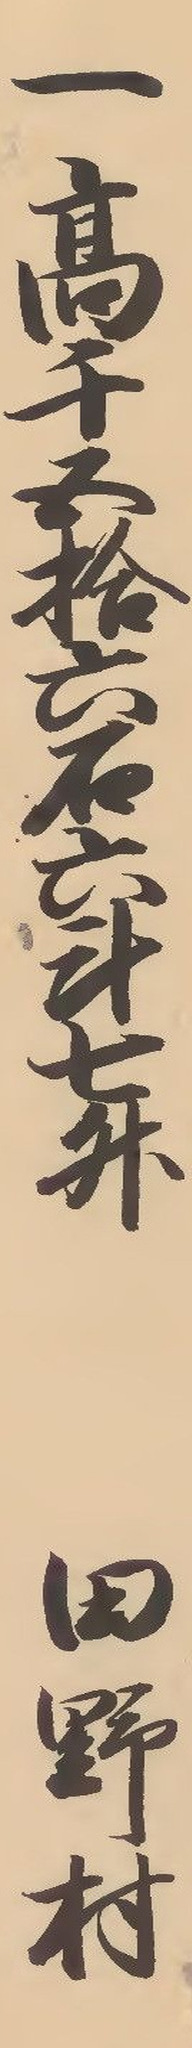一高千五拾六石六斗七升田野村
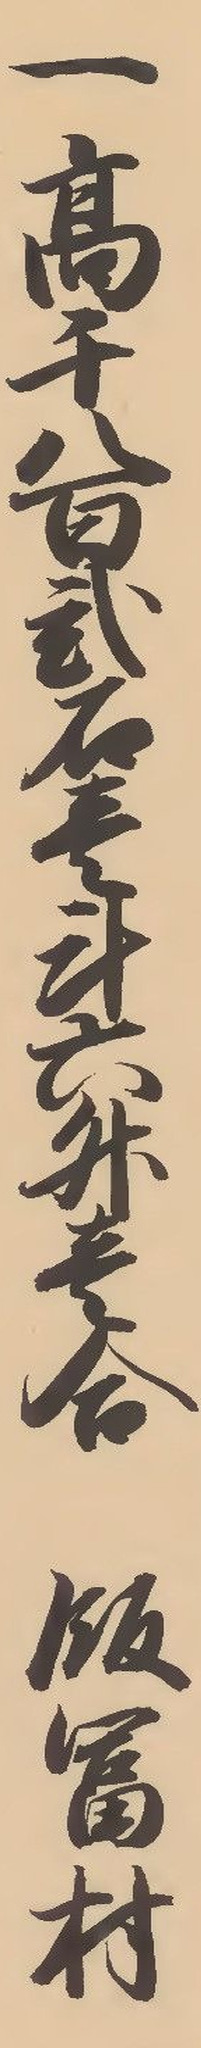一高千八百弐石壱斗六升壱合飯富村
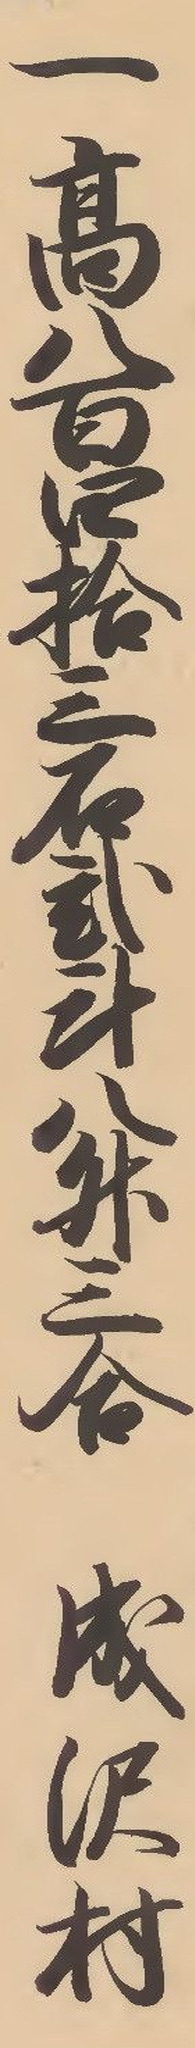一高八百四拾三石弐斗八升三合成沢村
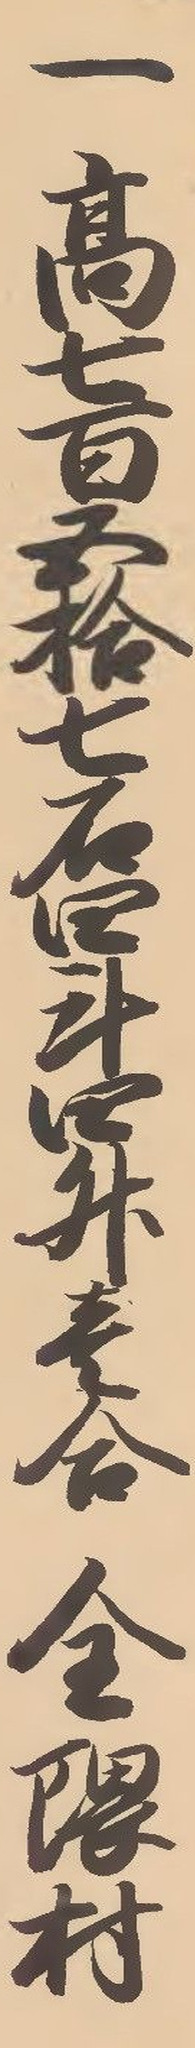一高七百五拾七石四斗四升壱合全隈村
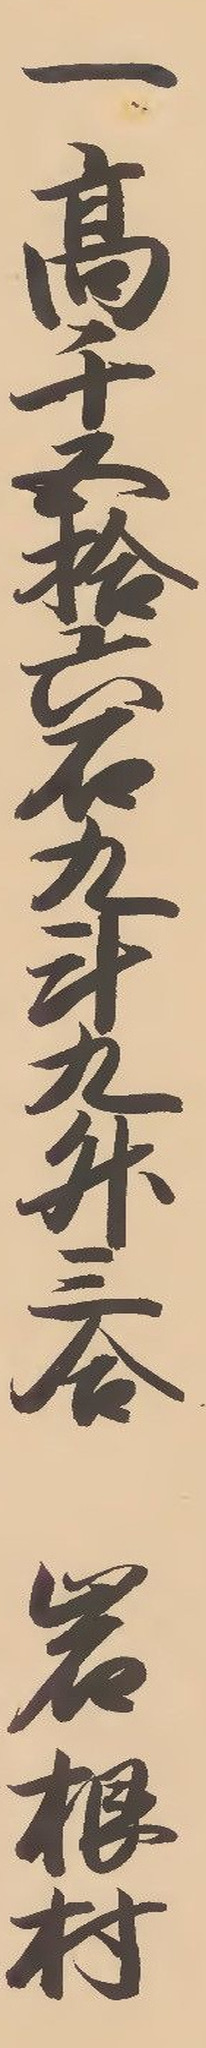一高千五拾六石九斗九升三合岩根村
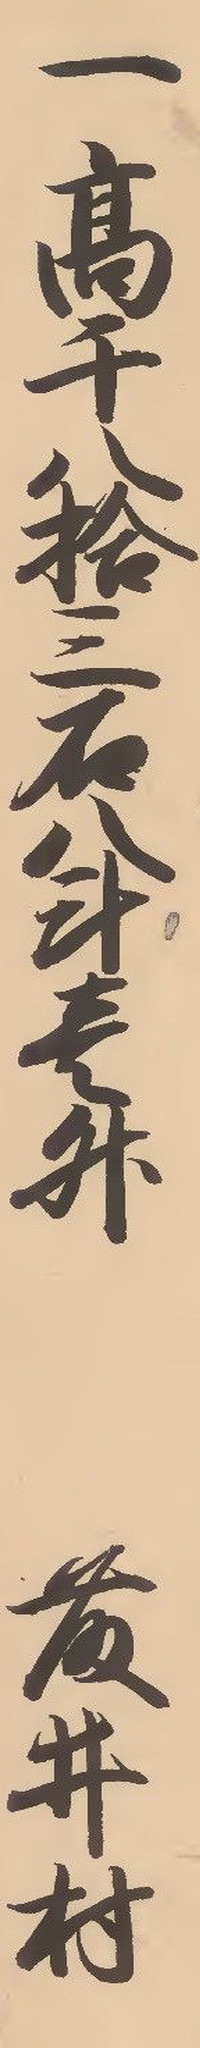一高千八拾三石八斗壱升藤井村
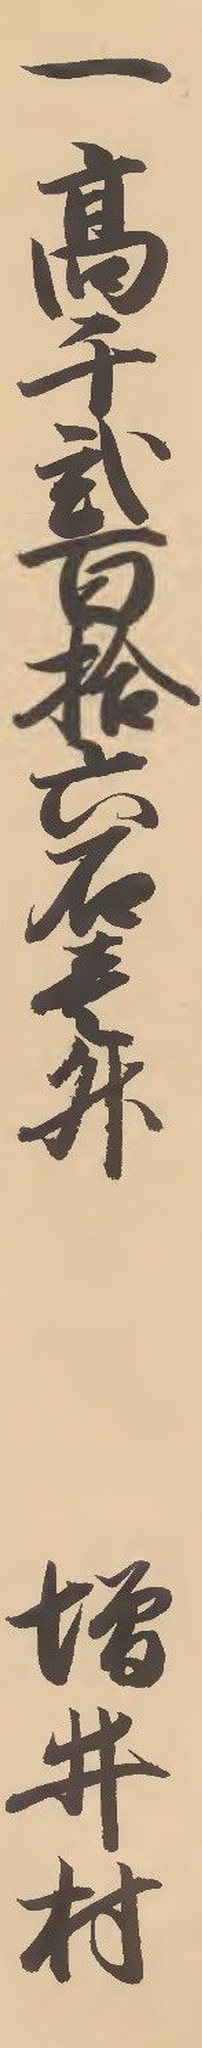一高千弐百拾六石壱升増井村

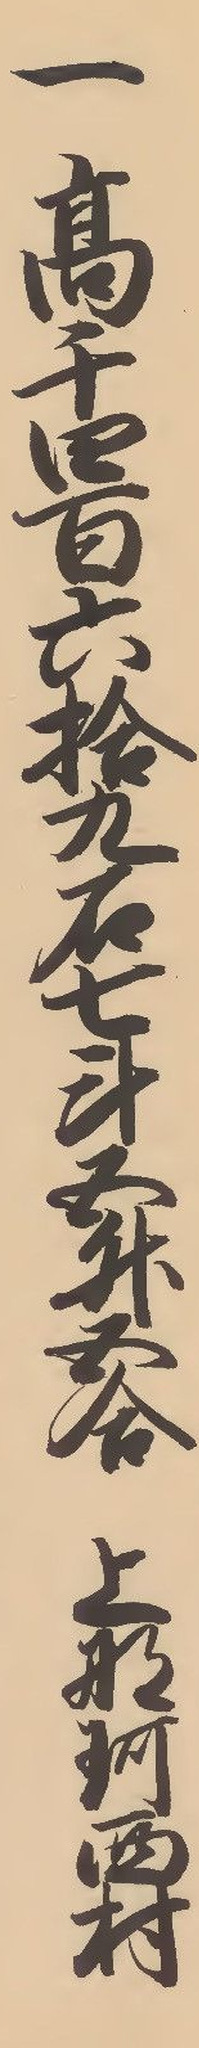一高千四百六拾九石七斗五升五合上那珂西村
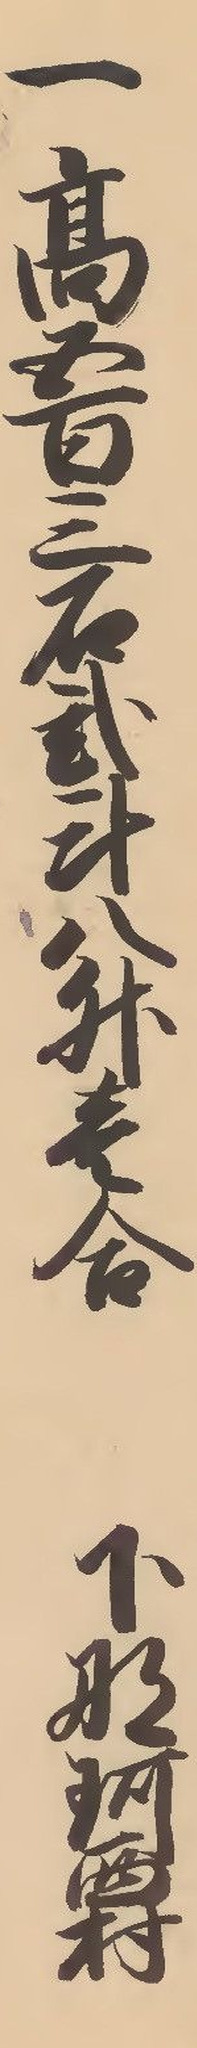一高五百三石弐斗八升壱合下那珂西村
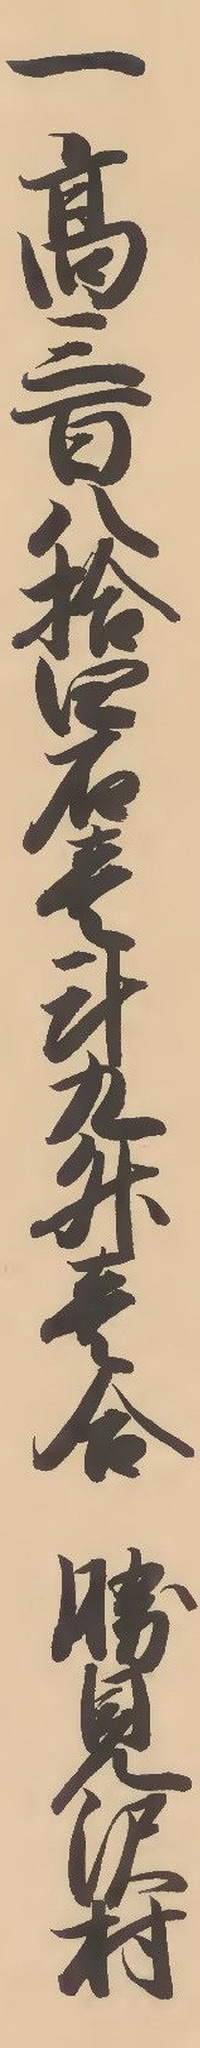一高三百八拾四石壱斗九升壱合勝見沢村
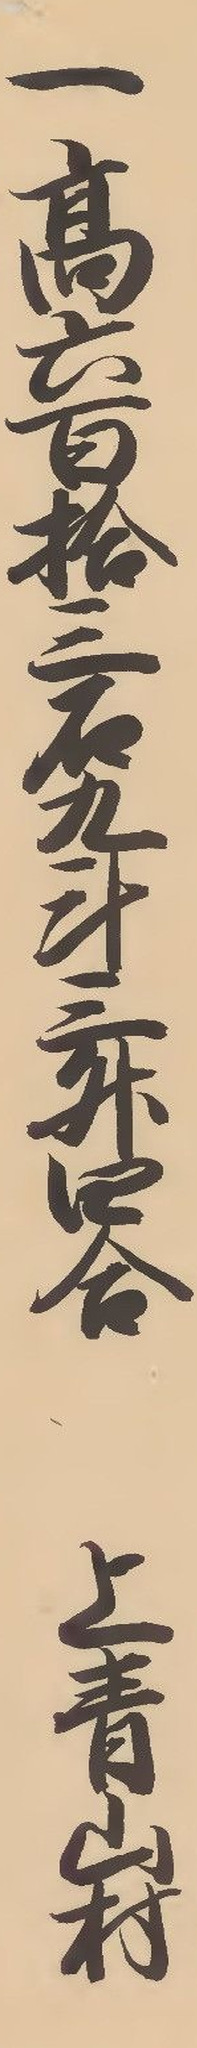一高六百拾三石九斗三升四合上青山村
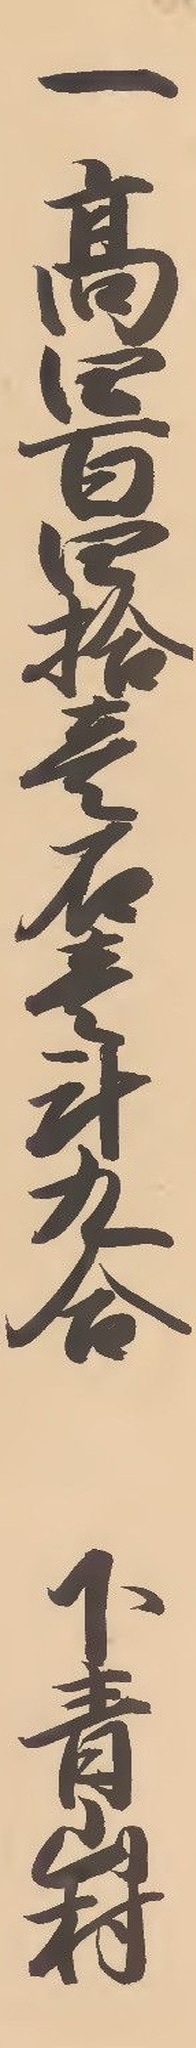一高四百四拾壱石壱斗九合下青山村
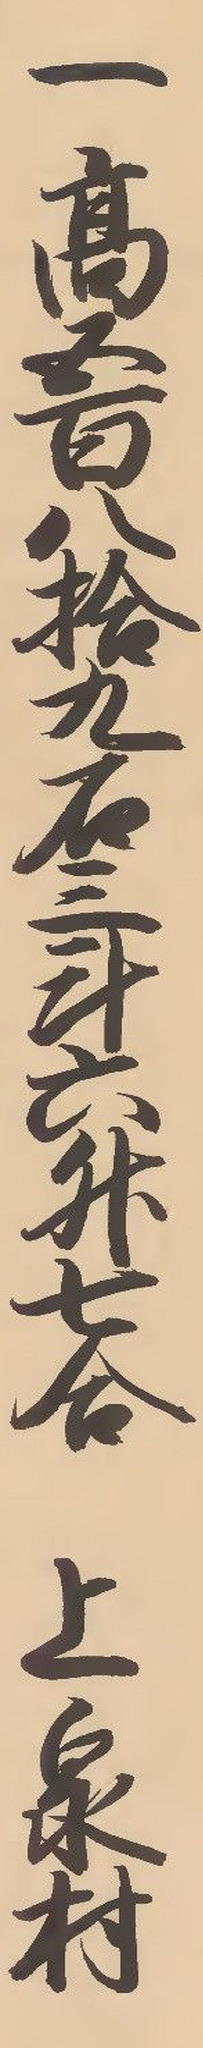一高五百八拾九石三斗六升七合上泉村
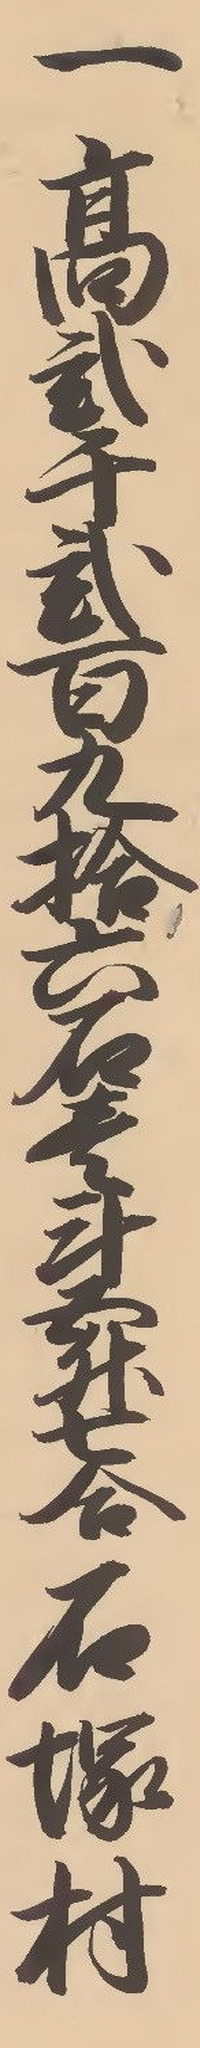一高弐千弐百九拾六石壱斗五升七合石塚村
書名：常陸国郷帳
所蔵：国立公文書館 National Archives of Japan
